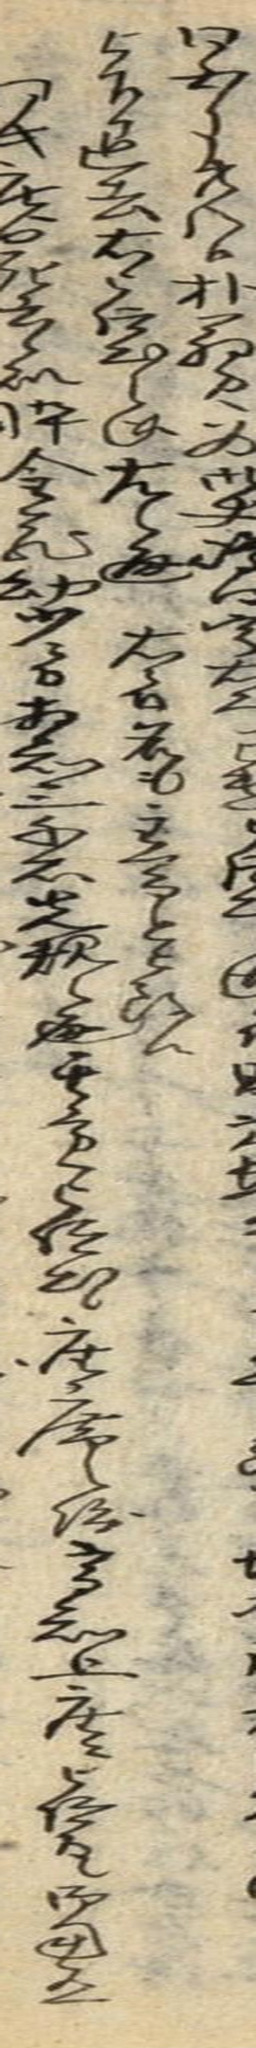同氏庄右衛門死去候処忰金蔵幼少に付拝知三千石先規之通其方へ被仰出候座席之儀高知上座に被仰付候御用有
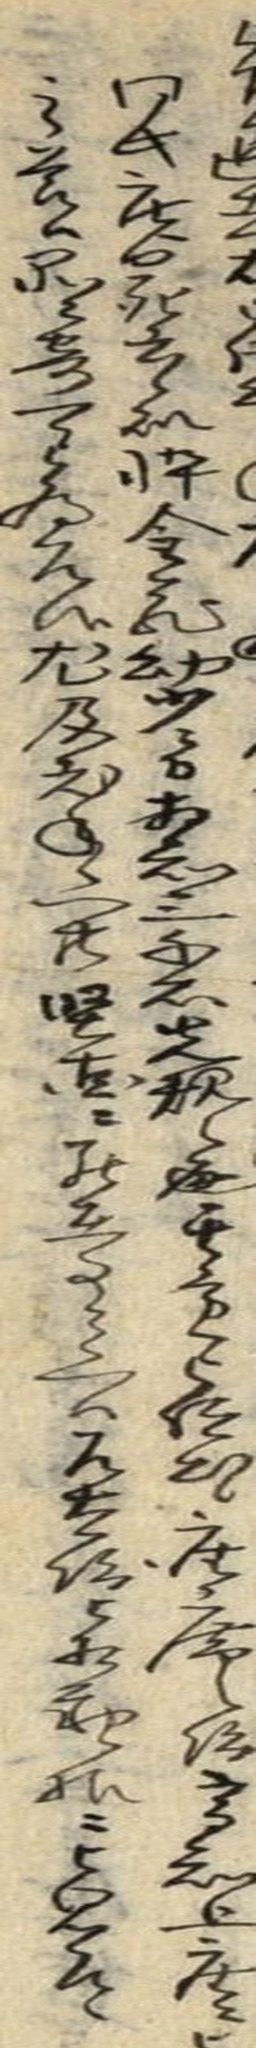之節は品に寄可被為召候尤及老年候へ共堅固に罷在事に候へは乍太儀被相勤候様に被思召候
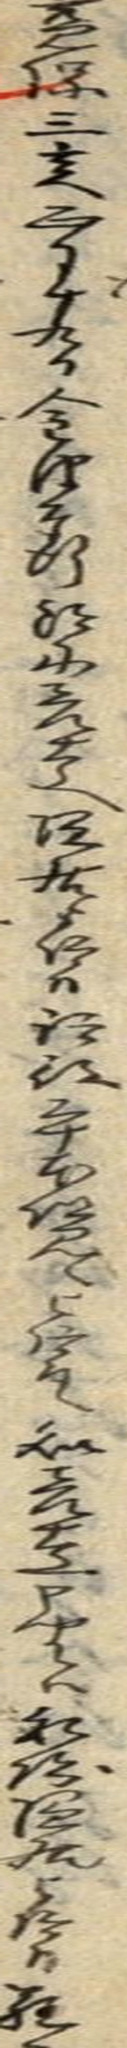一寛保三亥正月十九日金津奉行鈴木彦太夫隠居被仰付跡役平本但見へ被仰付候処彦太夫申聞候は私儀隠居被申付難有
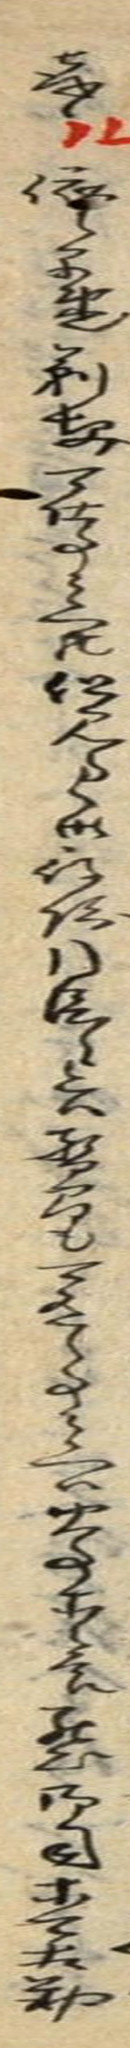被存候依之早速剃髪可仕事に候へ共但見方へ跡儀引渡候迄は暫間も可有之事に候へは火事等之節罷出御用等可相勤

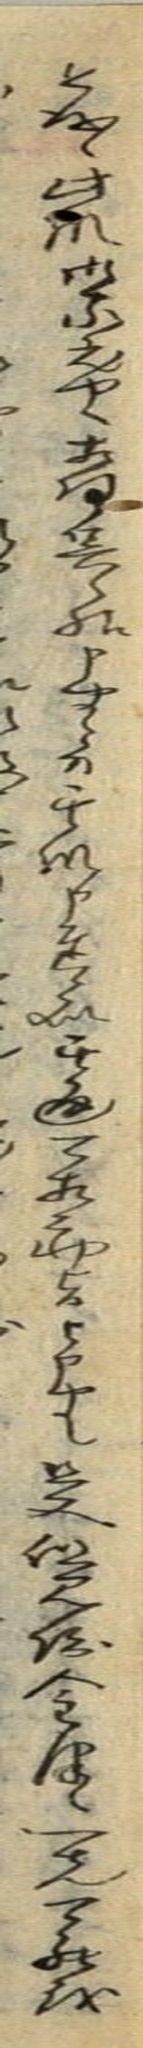と存候此段御家老中へ相伺呉候様申聞候に付其段申達候処其通可相勤旨被申聞候且又但見儀金津へ一先可罷越
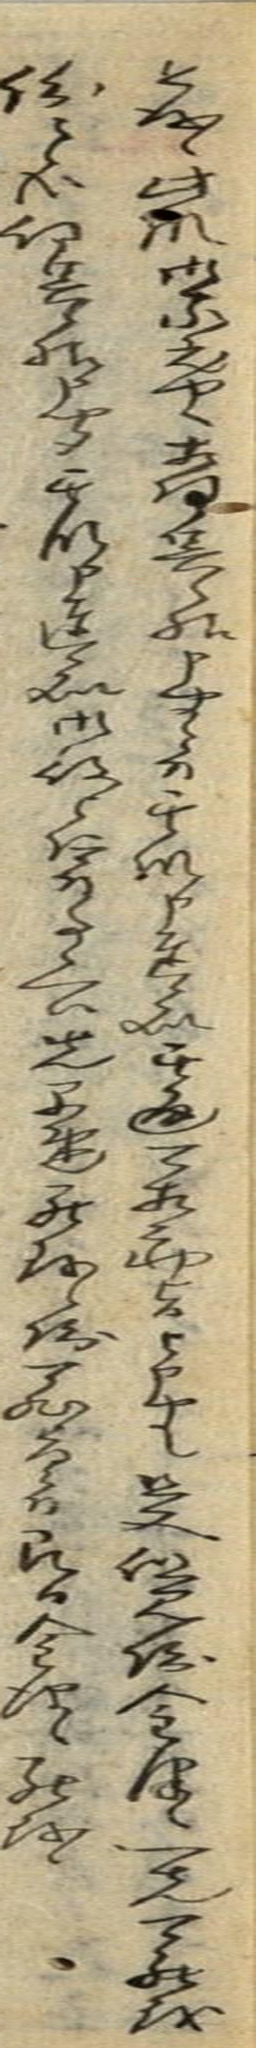儀に候哉伺呉候様申聞其段申達候処御役被仰付事に候へは先早速罷越候儀可然旨に付即日金津へ罷越候
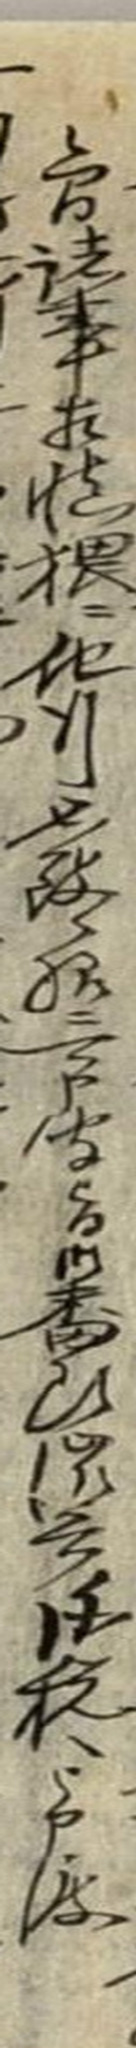候間諸事相慎猥に他行不致候様に可申伝旨御番頭渋谷弥税へ被申渡
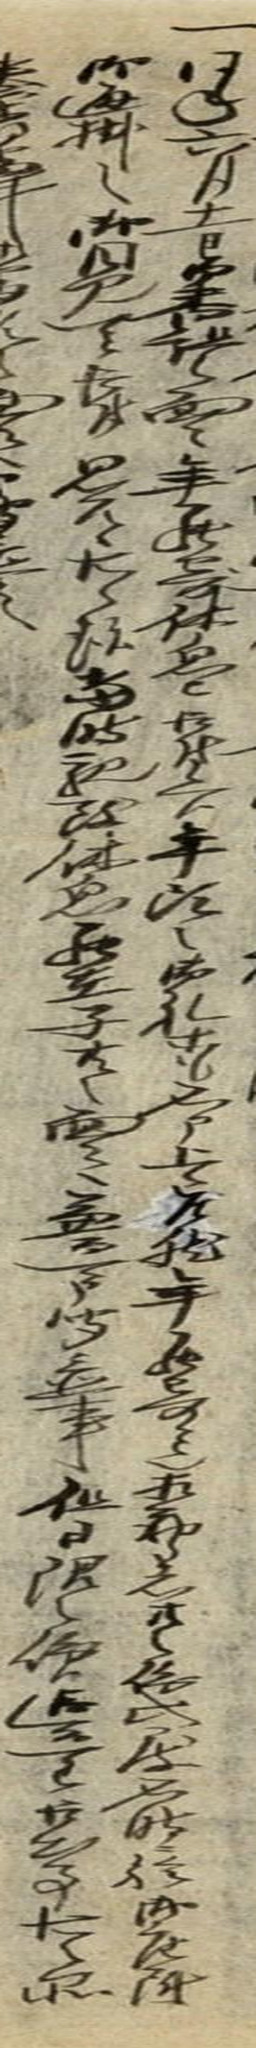御通掛之御目見可被仰付思召候右之趣当時親致休息罷在子共之面々へ兼而可申聞置事但日限之儀は追而可被仰出事右之品
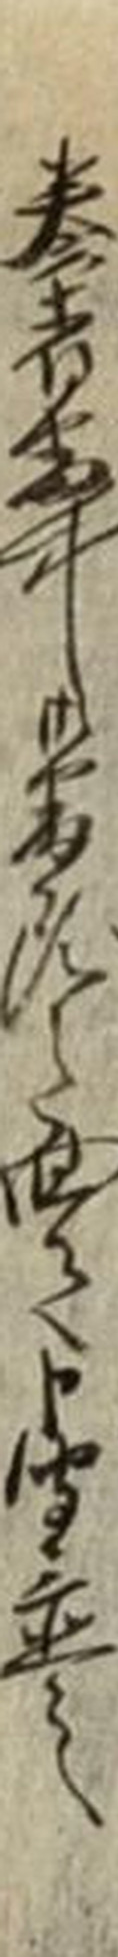奏者番中御番頭之面々へ申聞置之
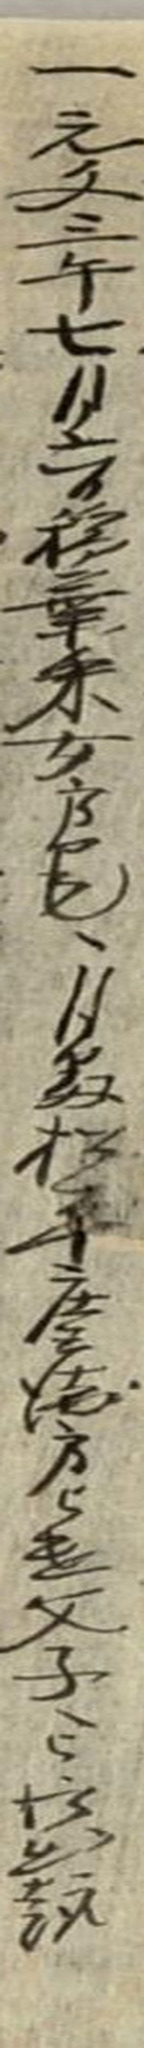一元文三午七月六日稻葉采女方宅へ月番松平庄兵衛方被遣父子へ被仰出候趣
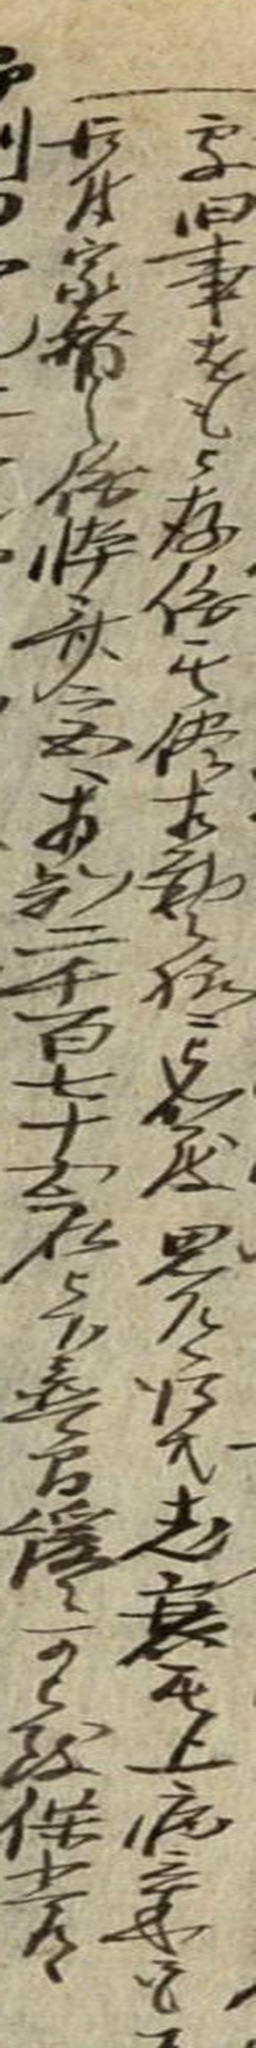仰付家督之儀忰斉宮へ拝知二千百七十五石被下置候間緩々可被致保養候
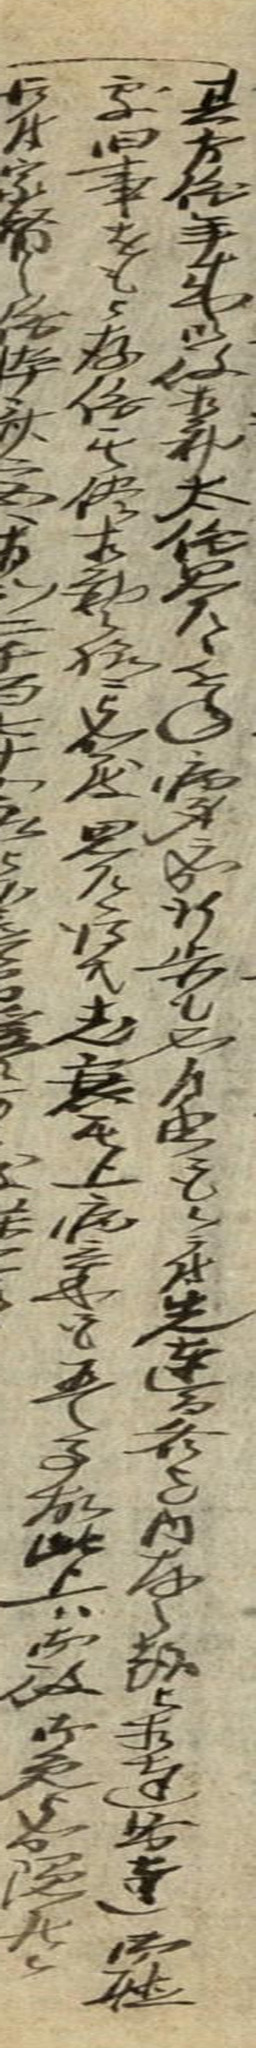処旧事をも被存儀其侭相勤候様に被成度思召に候得共老衰其上病気も有之事故此上は御役御免被成隠居被
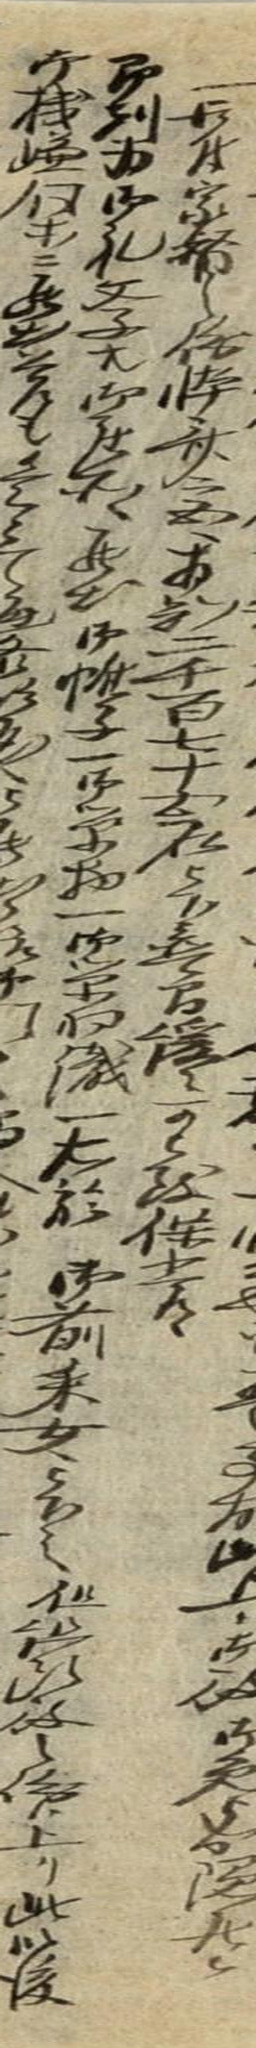即刻為御礼父子共御座所へ罷出御帷子一御単物一御単羽織一右於御前采女へ被下之但組頭役之儀は上り此以後
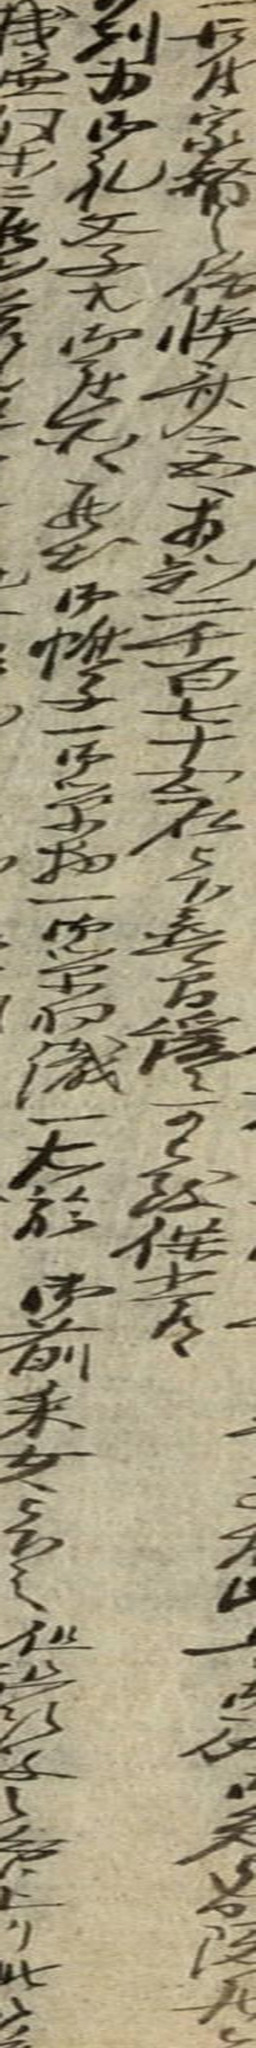即刻為御礼父子共御座所へ罷出御帷子一御単物一御単羽織一右於御前采女へ被下之但組頭役之儀は上り此以後
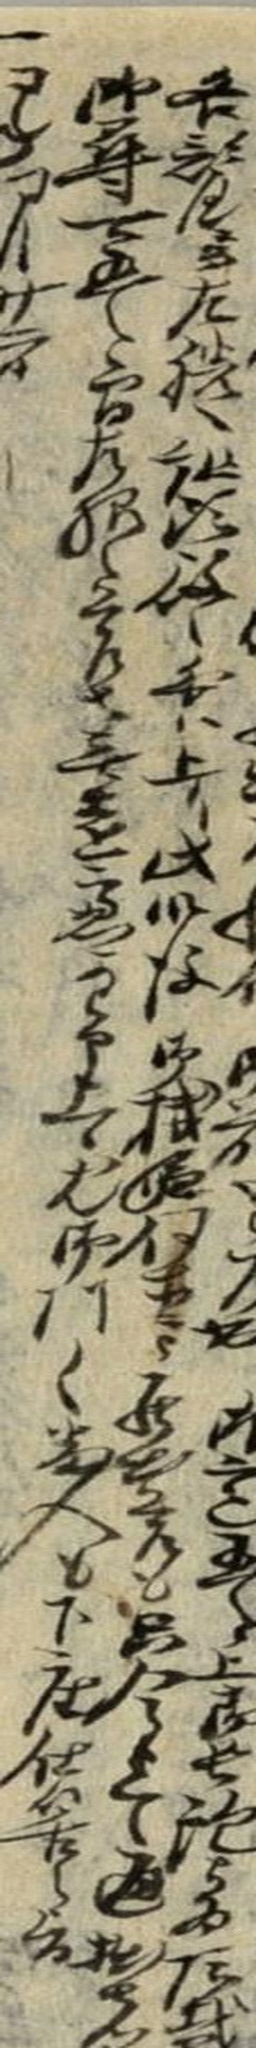御尋可有之候間左様之節は無遠慮可被申上候尤御門〳〵番人も下座仕筈之旨
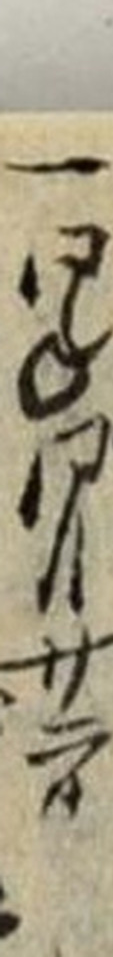一同年同月廿二日
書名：御用并被仰出之部
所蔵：福井県文書館 Fukui Prefectural Archives
